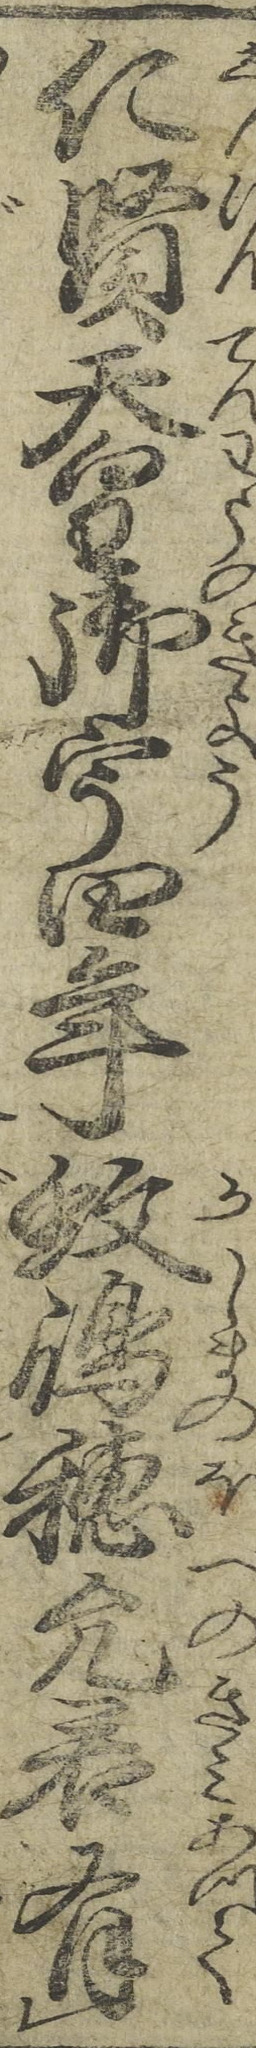仁賢天皇御宇四年蚊嶋穂台君有
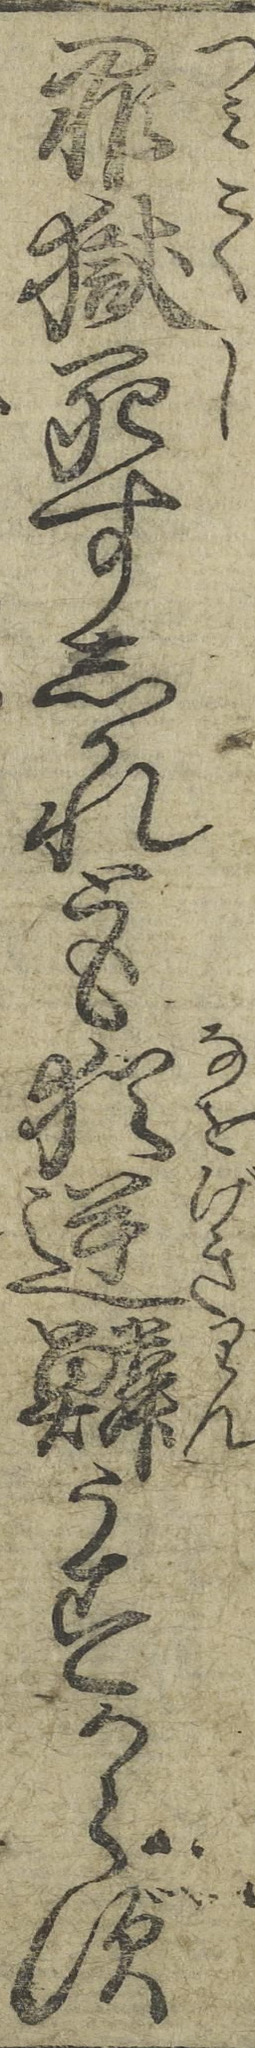罪獄死すしかれとも猶逆鱗うすからず
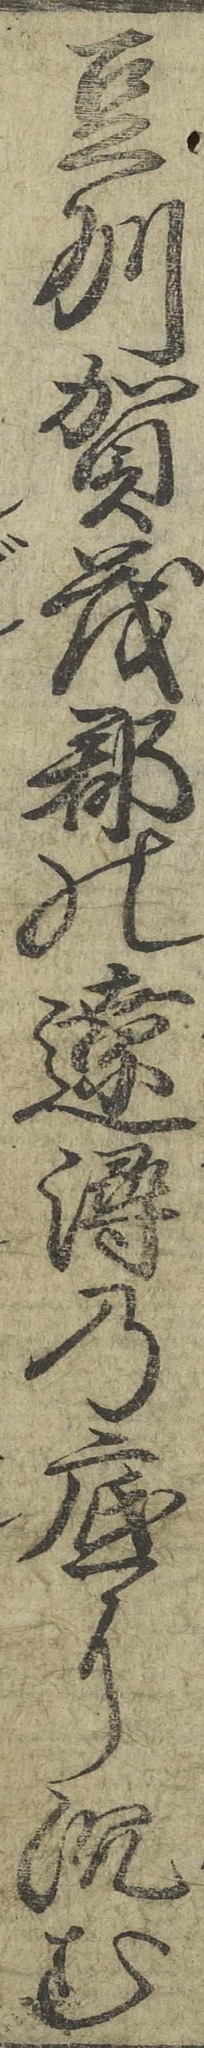豆州加茂郡の遼潯の底に沈む
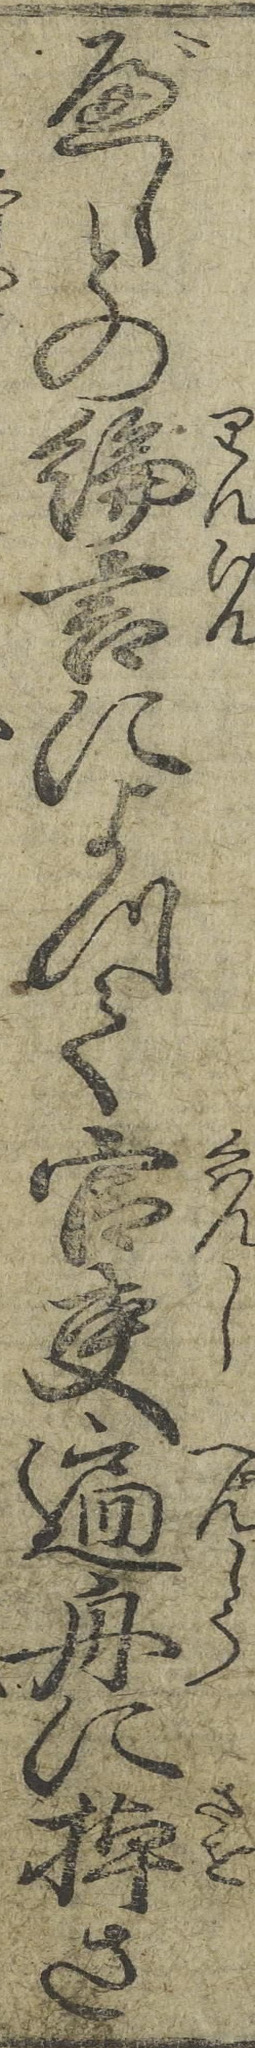べしとの綸言によつて官吏遍舟に棹さ
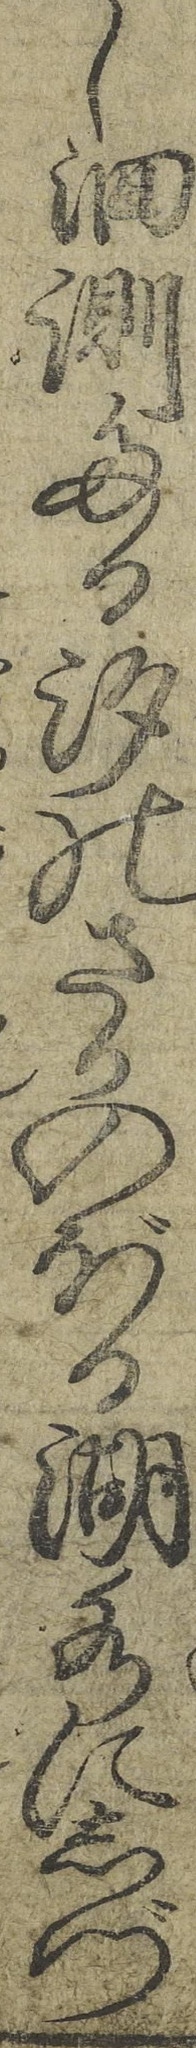し洄測たる汐のさかのぼる湖水にしづ

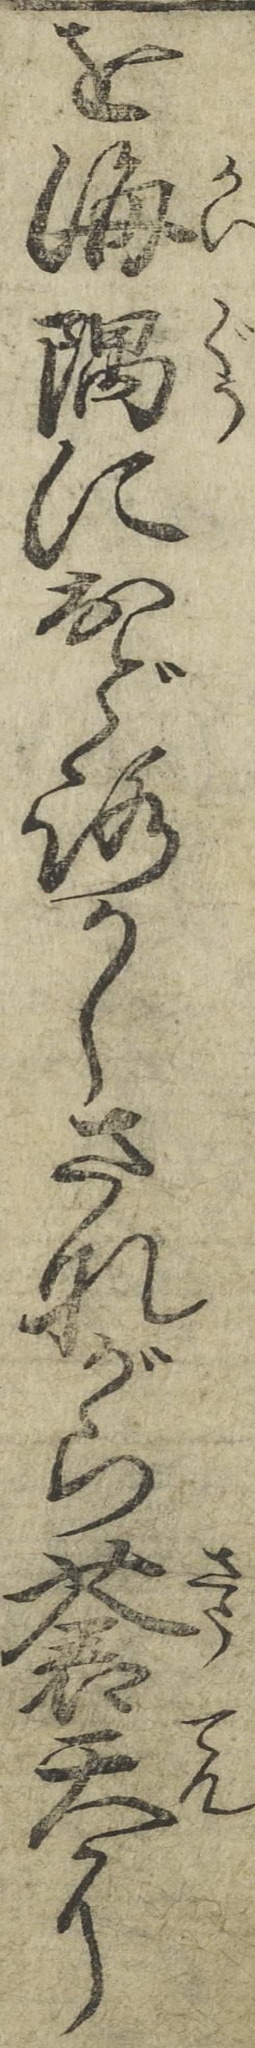を海隅におどろかしさながら蒼天に
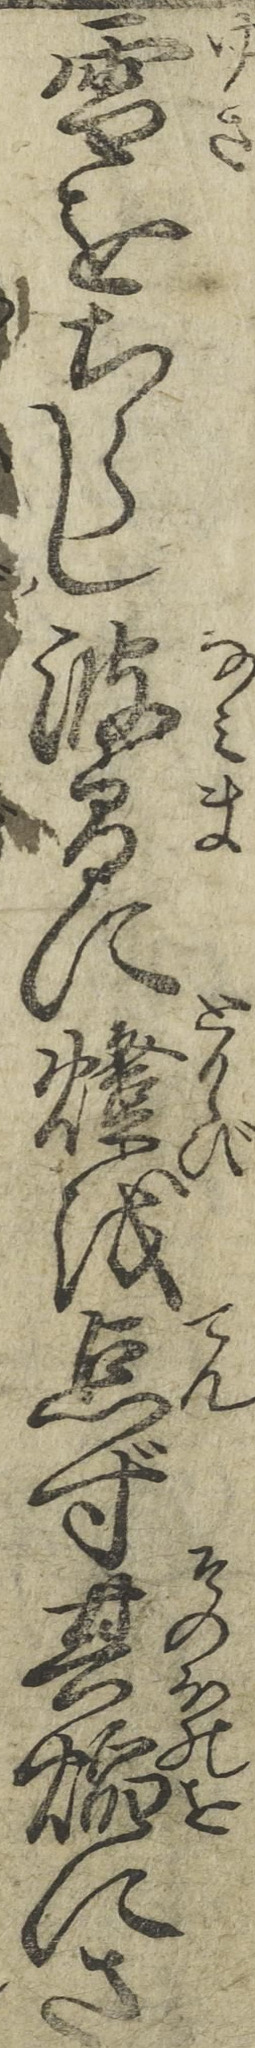雪をちらし波間に灯を点ず其焔にさ
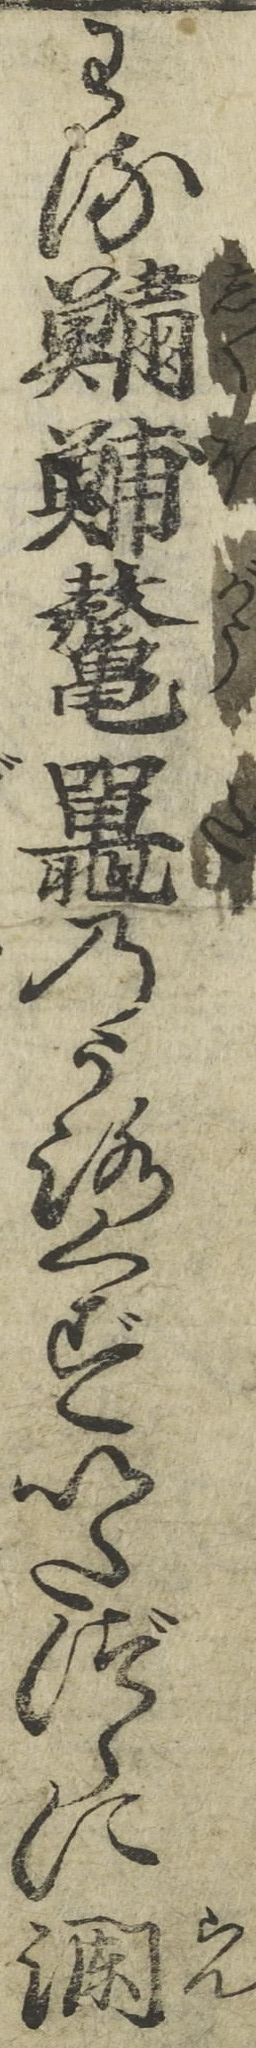わる鯆鼇鼉のうろくずいたづらに瀾
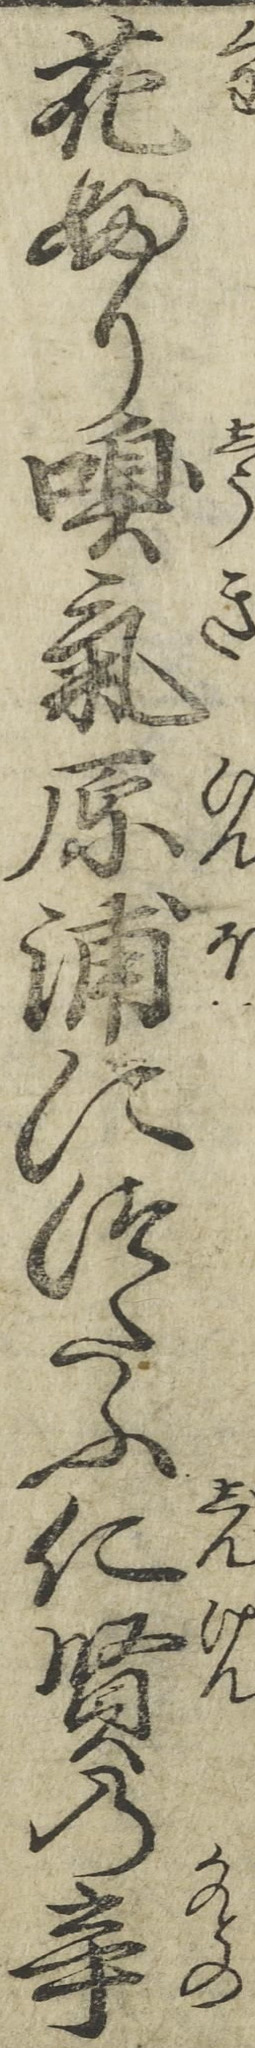花ふり嗅気原浦につたふ仁賢の辛
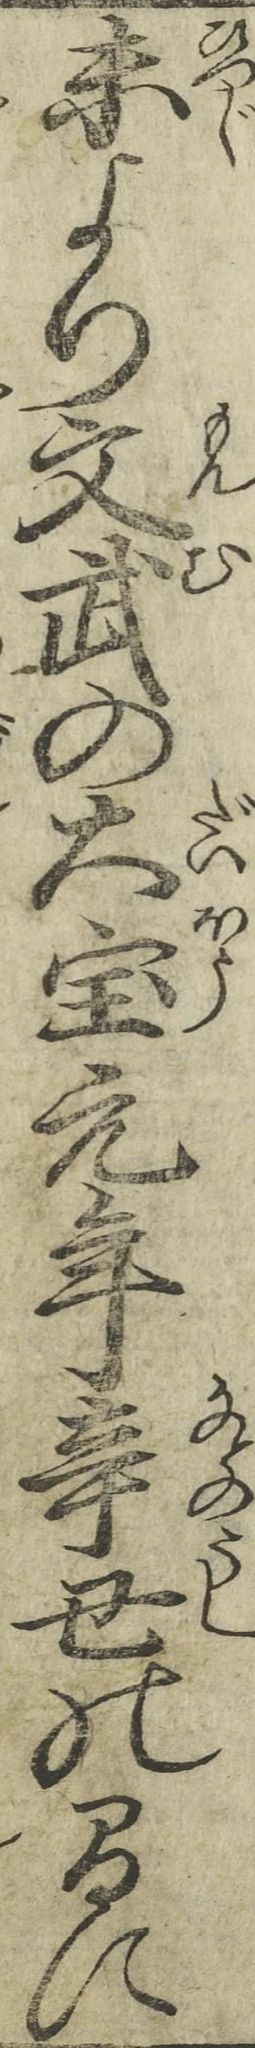未より文武の大宝元年辛丑の間に
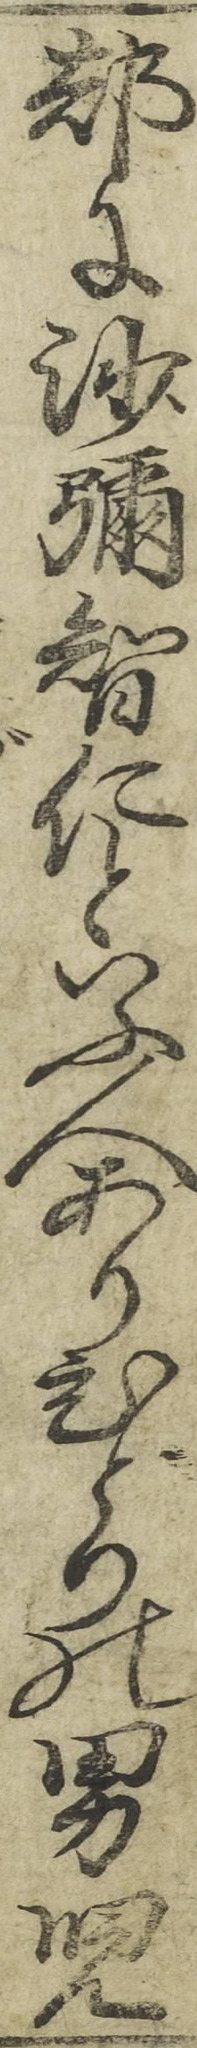都に沙弥智仁といふ人ありひとりの男児
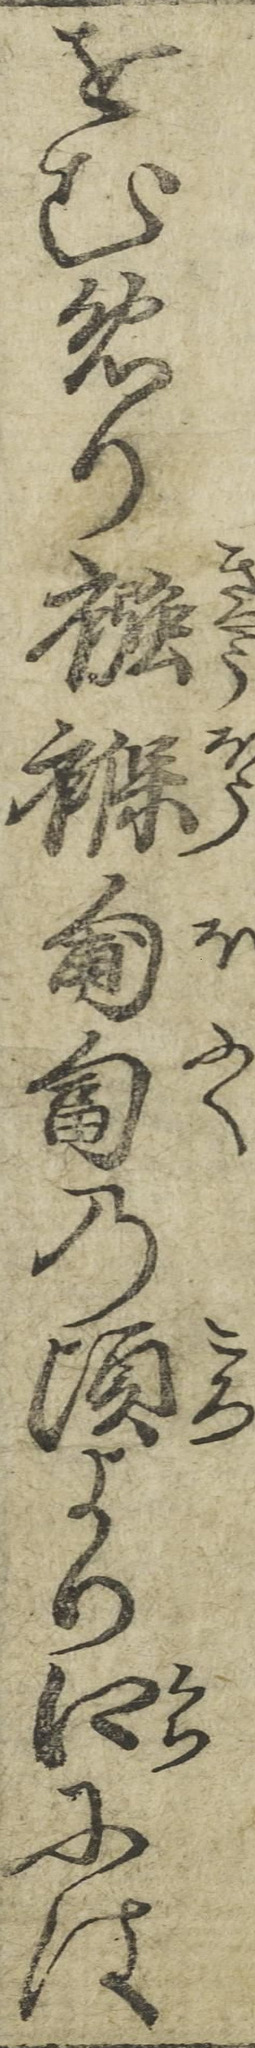をむめり襁褓匍匐の頃より口には
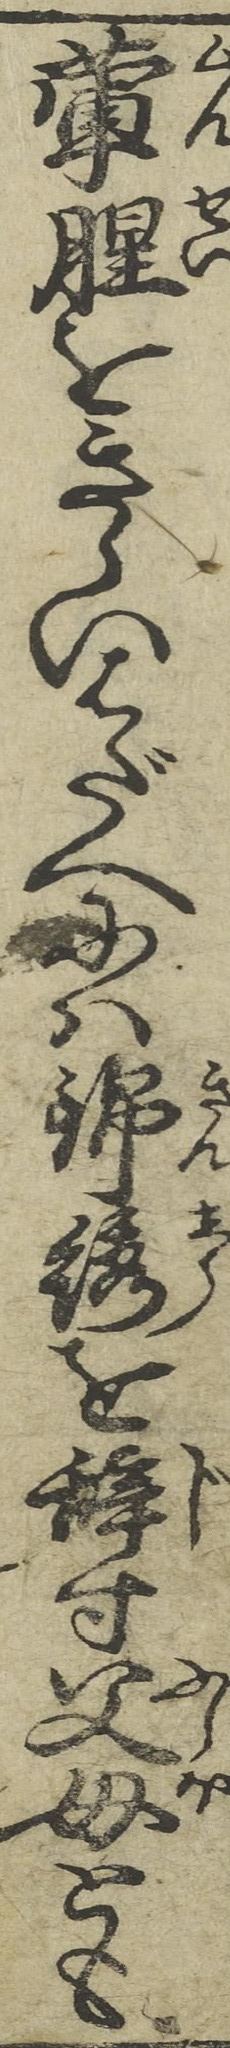葷腥をきらいはだへには錦繍を辞す父母とも
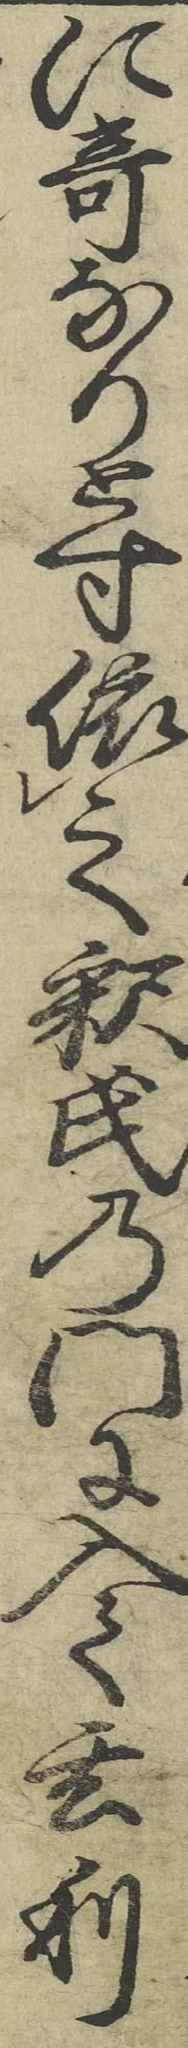に奇なりとす依之釈氏の門に入て玄利
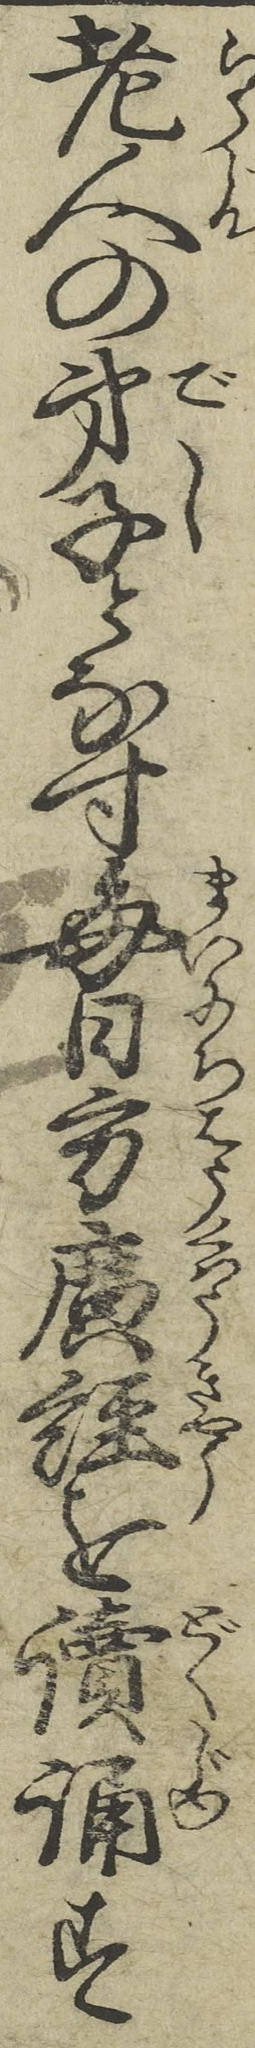老人の弟子となす毎日方広経を読誦す
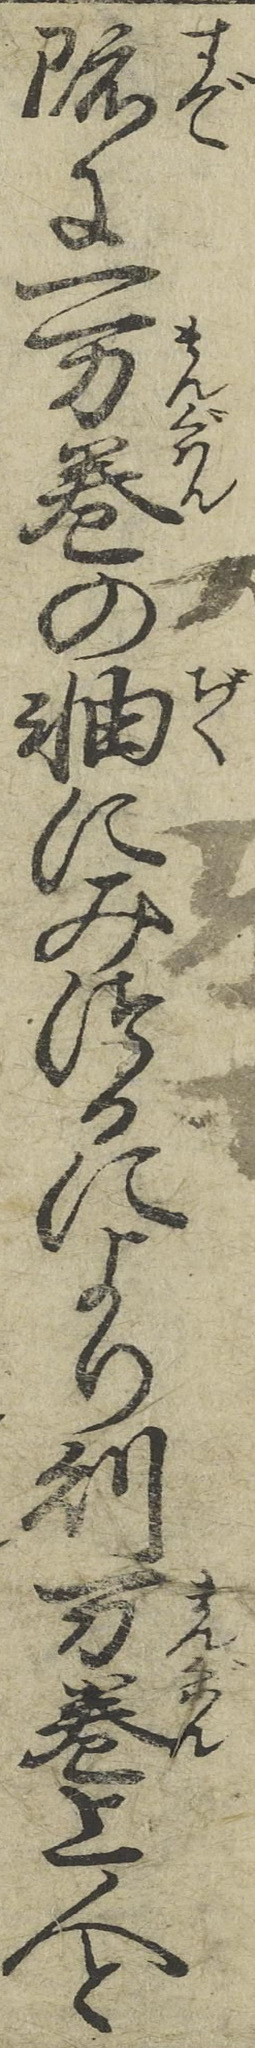既に一万巻の軸にみつるにより則万巻上人と
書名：伊豆國熱海温泉縁起
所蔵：東京大学地震研究所図書室 Earthquake Research Institute Library, The University of Tokyo, JAPAN
